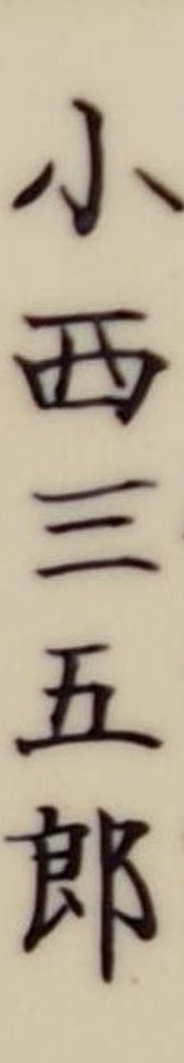小西三五郎
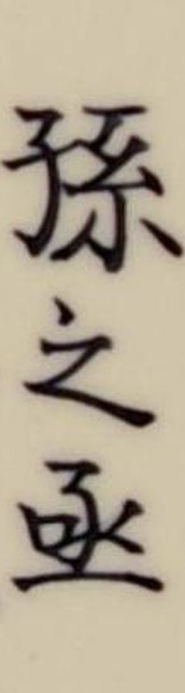孫之丞
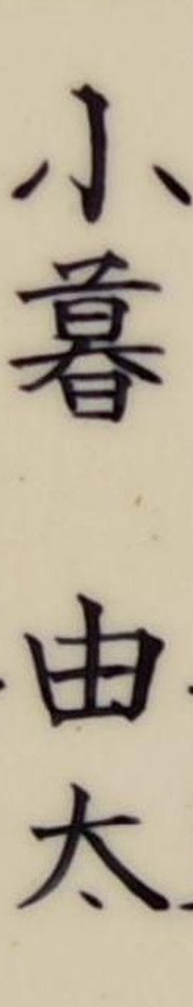小暮由太
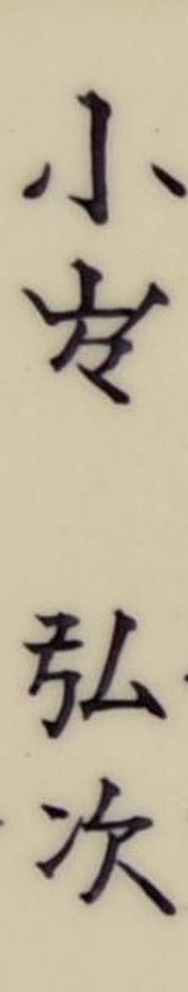小山弘次
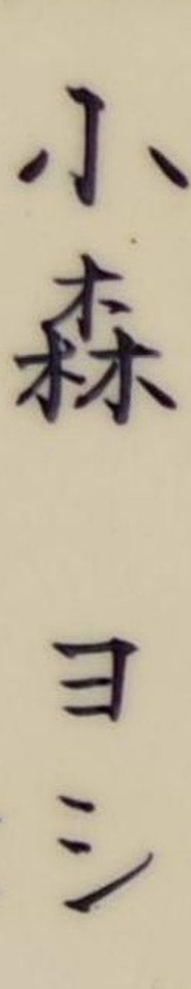小森ヨシ
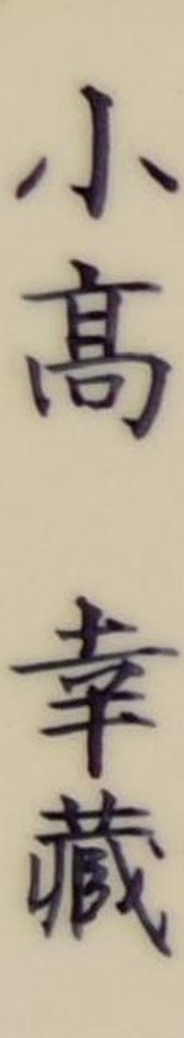小高幸蔵
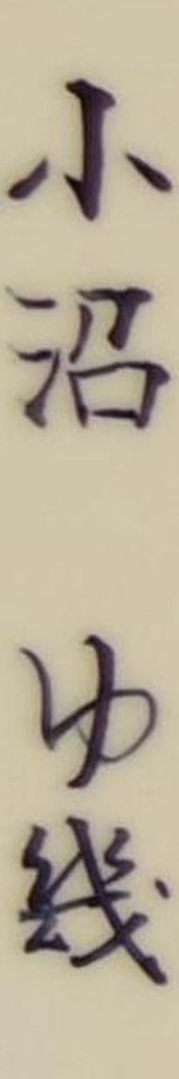小沼ゆき
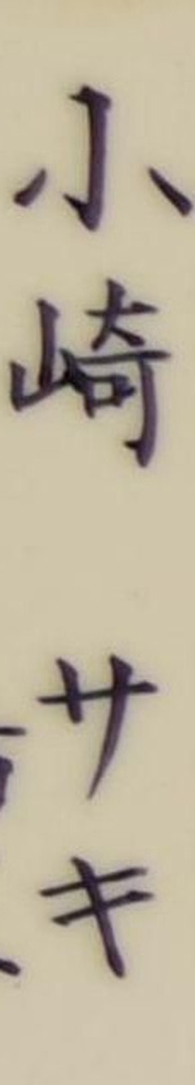小崎サキ

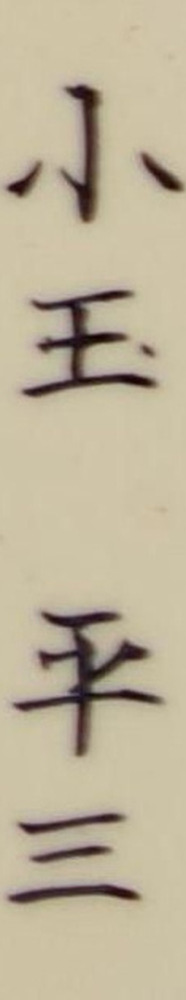小玉平三
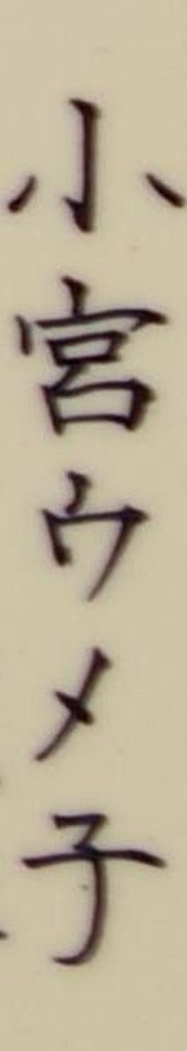小宮ウメ子
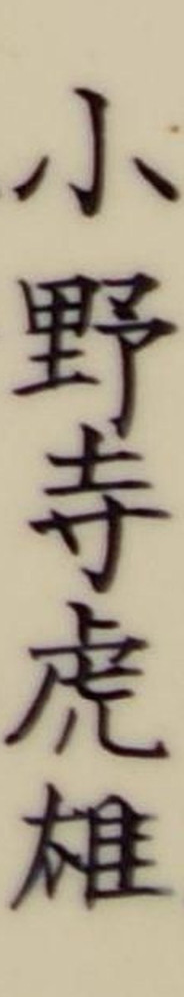小野寺虎雄
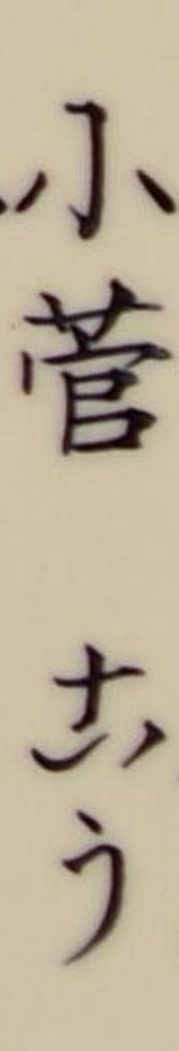小菅こう
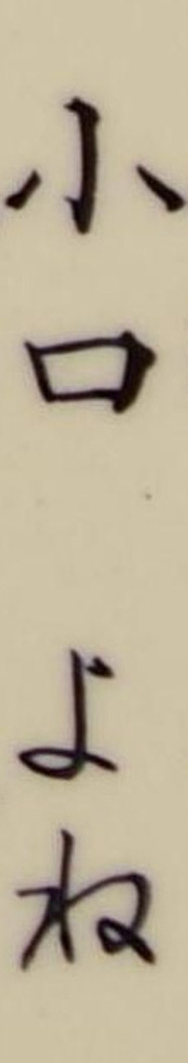小口よね
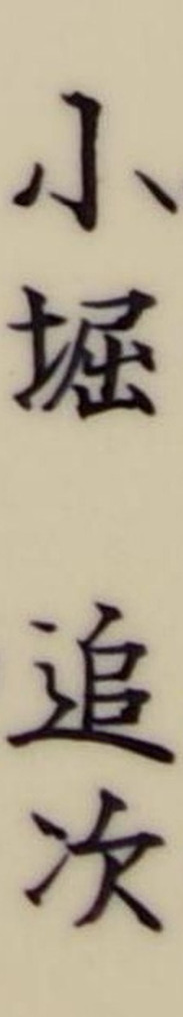小堀追次
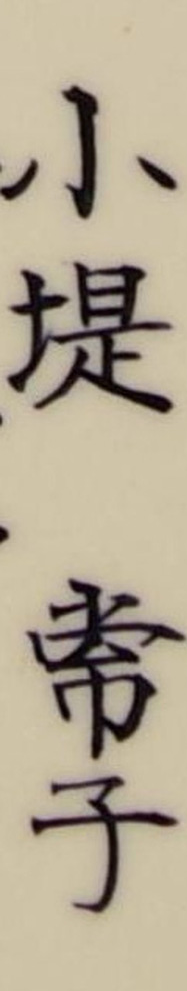小堤常子
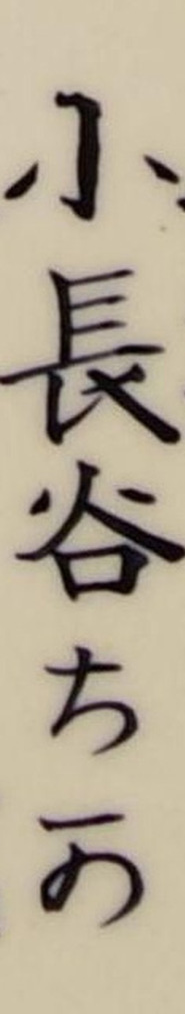小長谷ちか
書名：E~L
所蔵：高野山金剛峯寺
